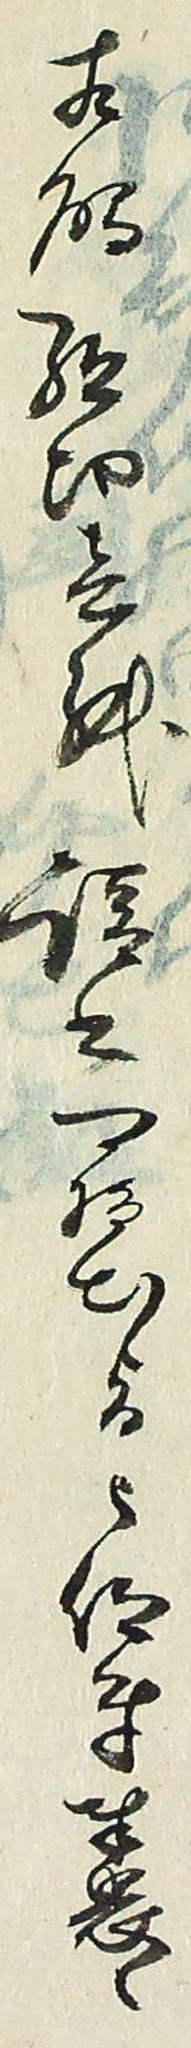相触組切壱紙請書可指出旨被仰付奉畏候
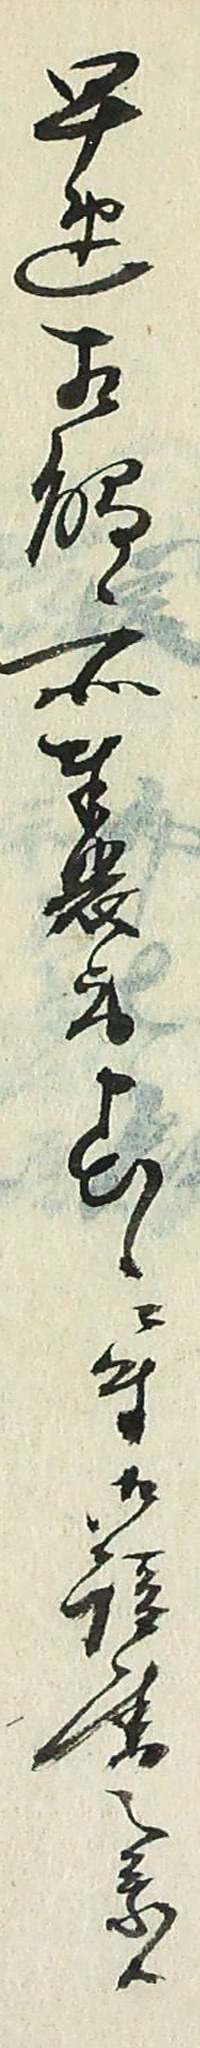早速相触候所奉畏旨申出候に付御請書之義は
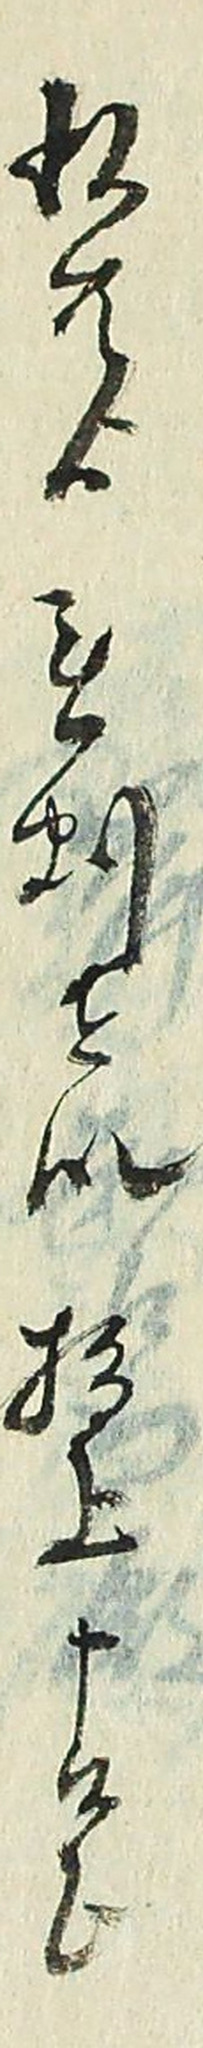私共ゟ連判を以指上申候以上
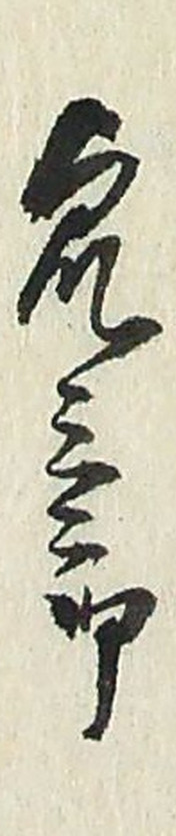虎三郎
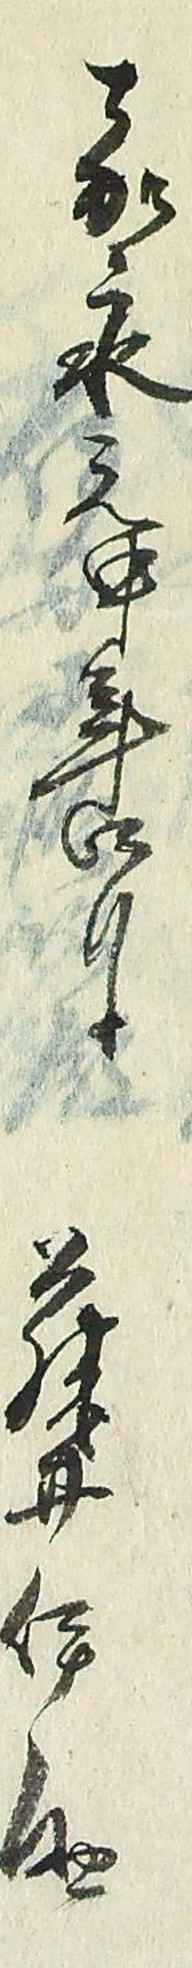嘉永元申年四月藤井伊助
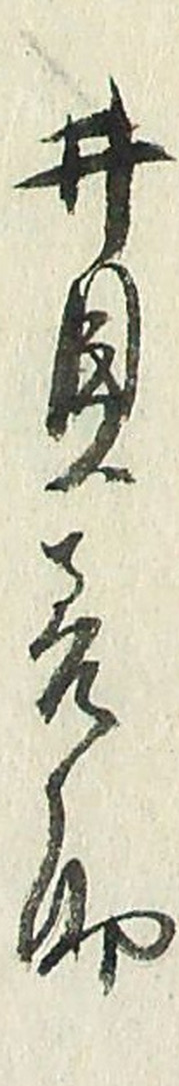井貝善助

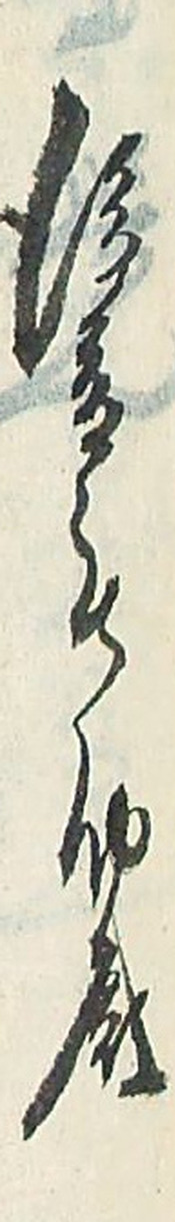後藤庄助殿
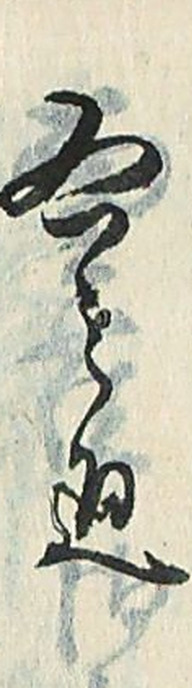右之通
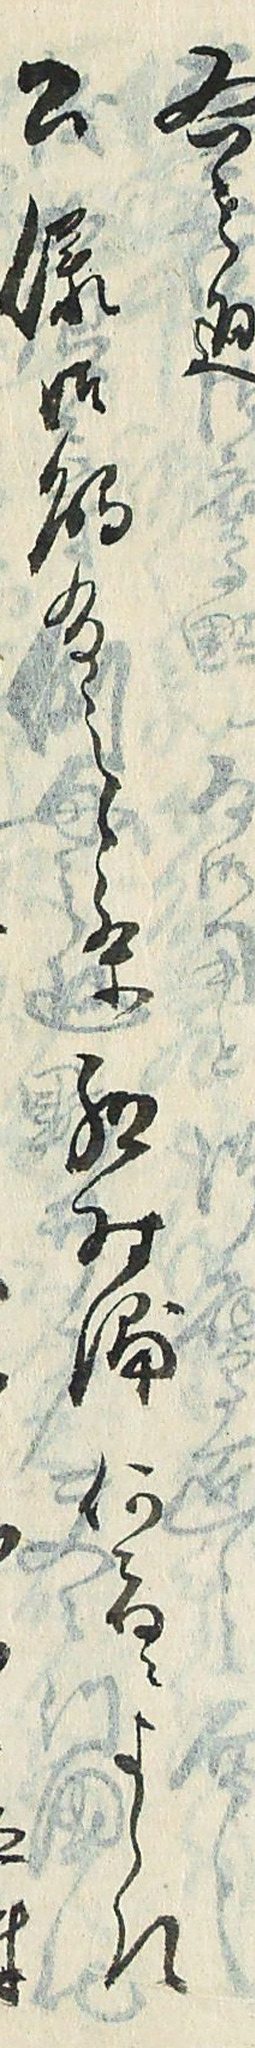公儀御触有之候条組村浦何者によらす
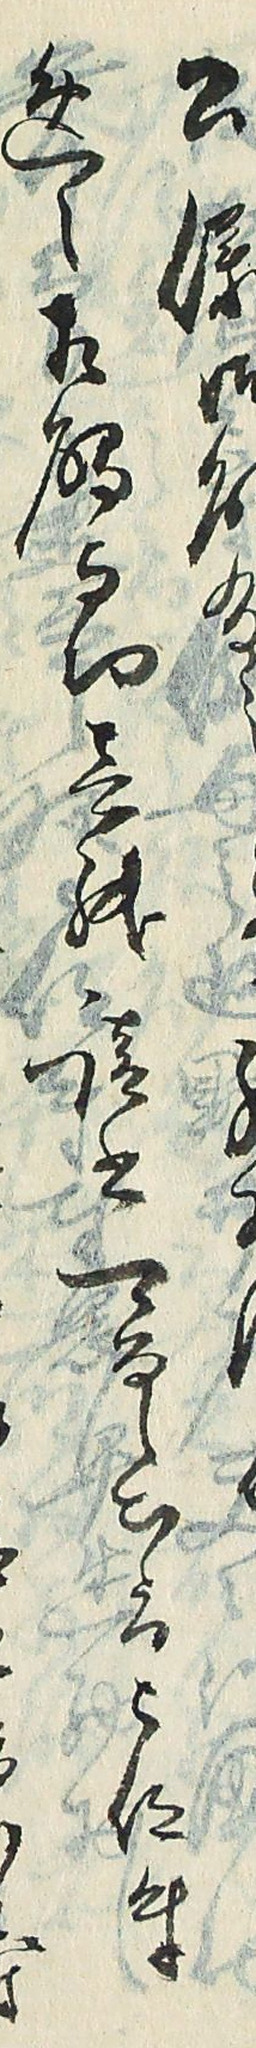逸々相触与切壱紙請書可差出旨被仰付
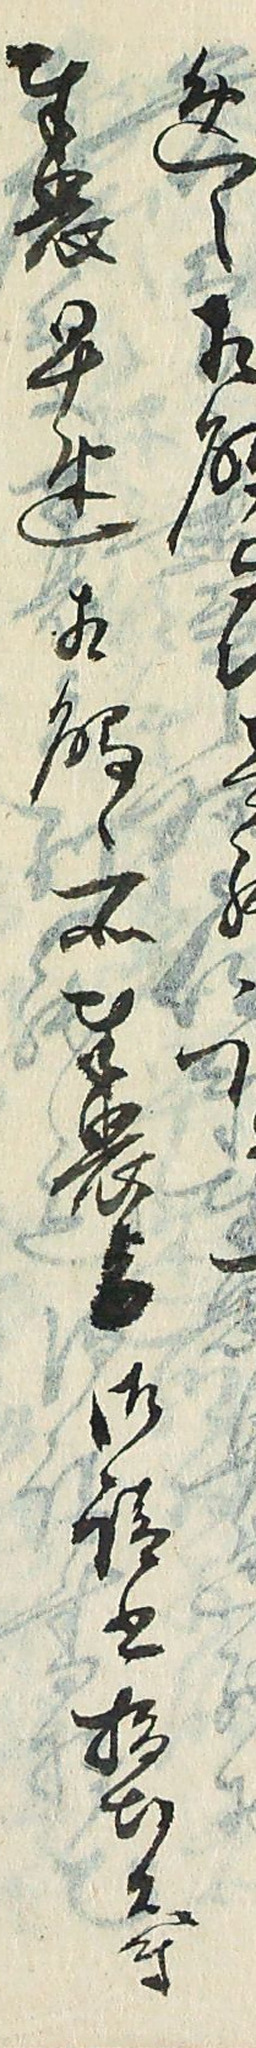奉畏早速相触候所奉畏旨御請書指出候に付
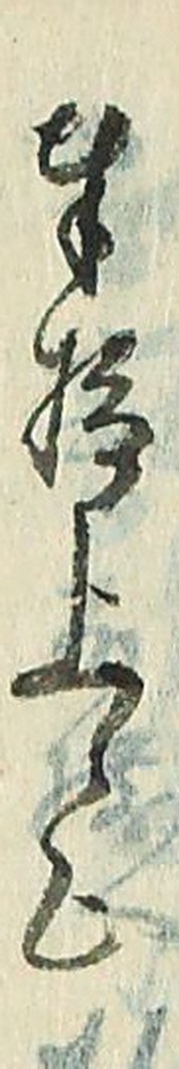奉指上候以上
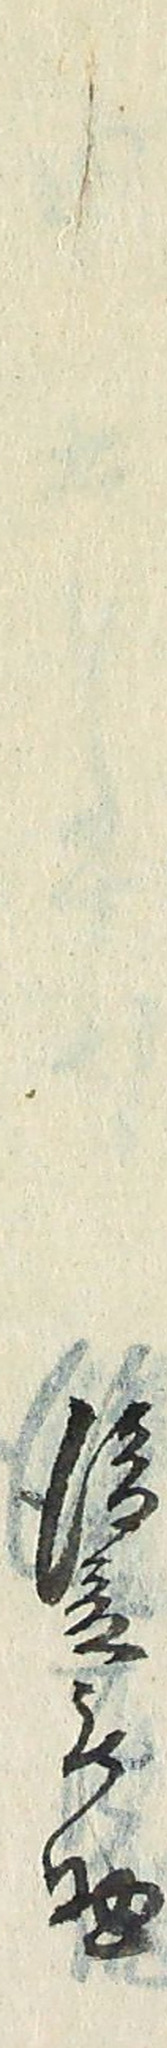後藤庄助
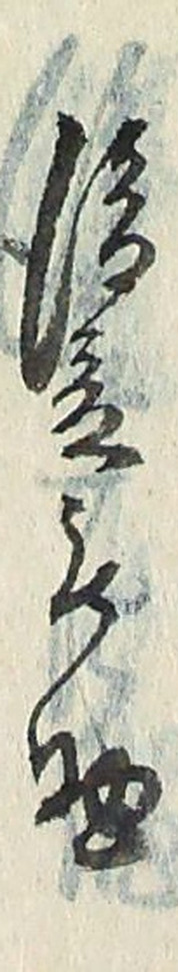後藤庄助
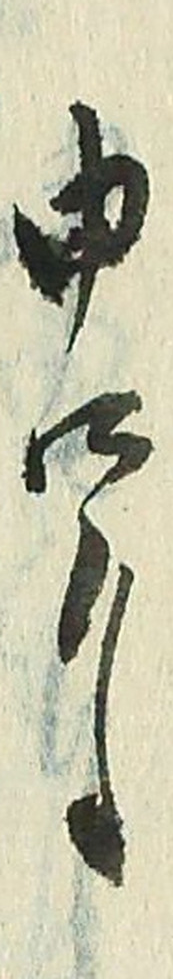申四月
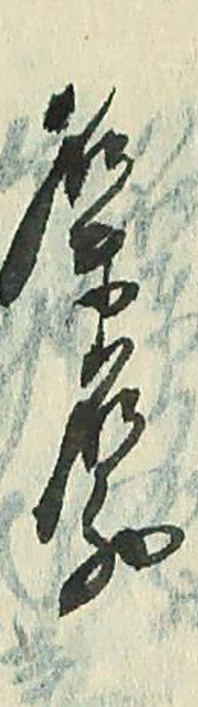名東名西
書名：諸御用御□受書控
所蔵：鳴門教育大学 Naruto University of Education
